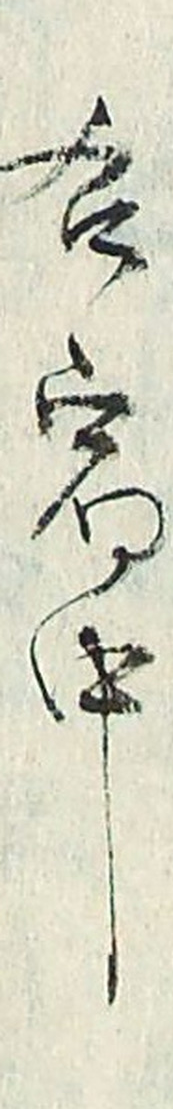右宿中
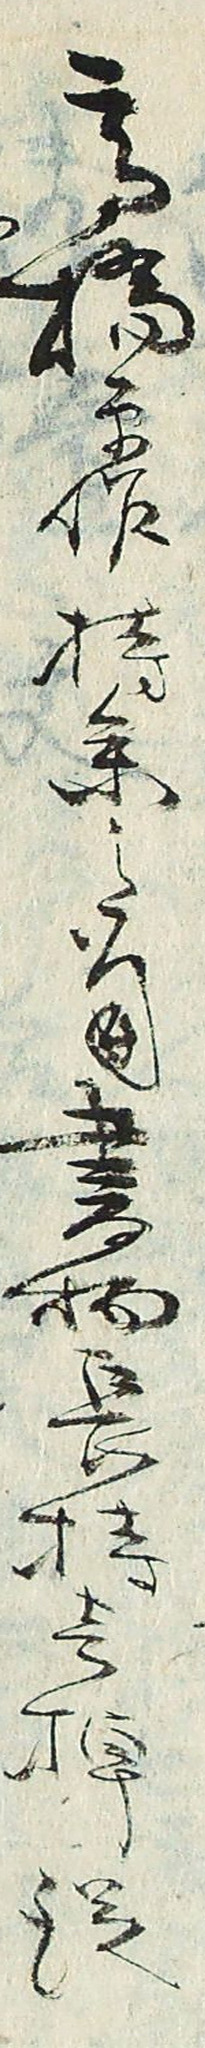高橋平作持参之御用書物長持壱棹従
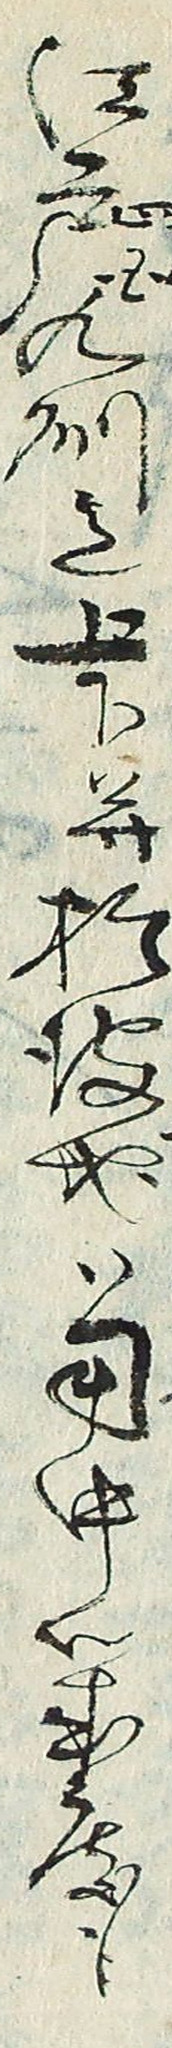江戸四国九州迄上下并於彼地御用中幾度も
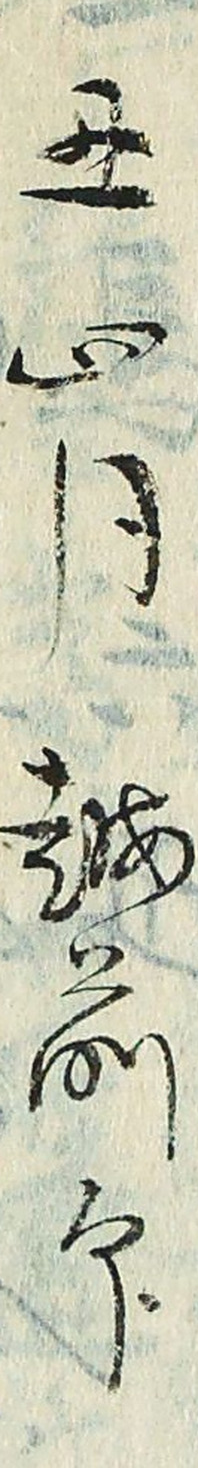丑四月越前印
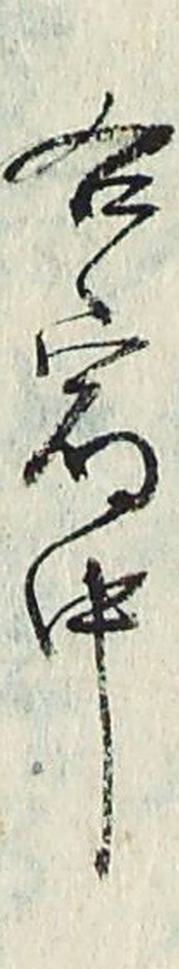右宿中
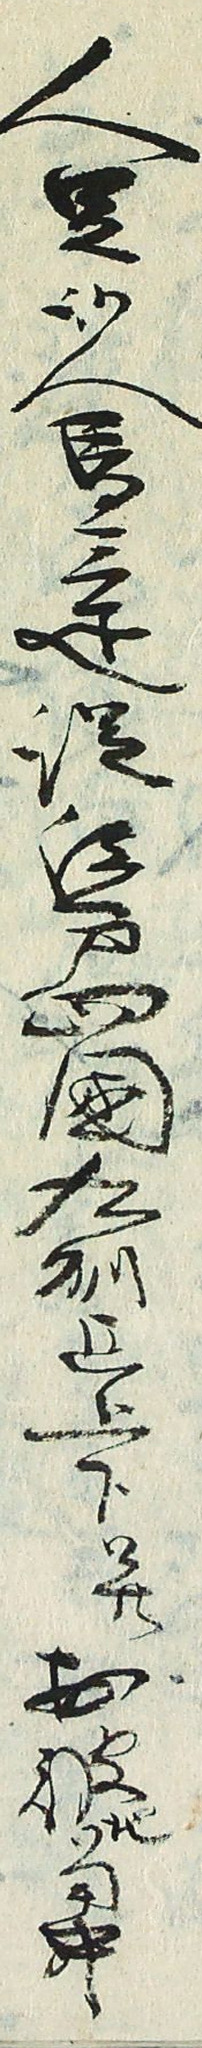人足弐人馬三疋従江戸四国九州迄上下并於彼地御用中
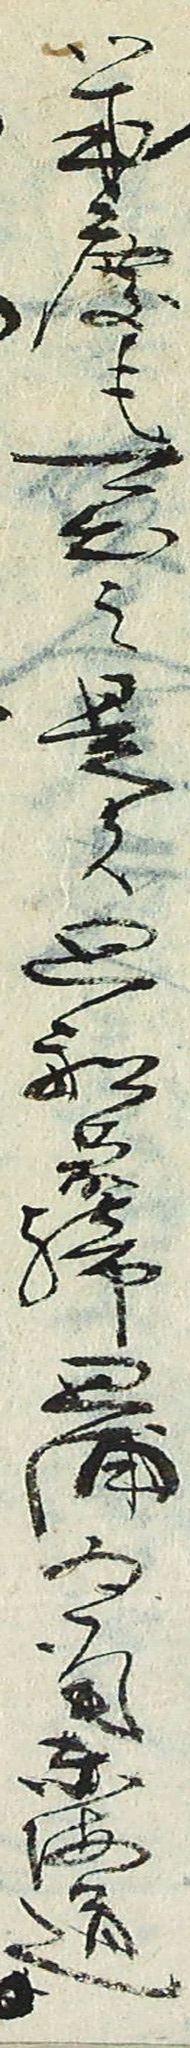幾度も可出之是は廻船御取締廻浦為御用東海道
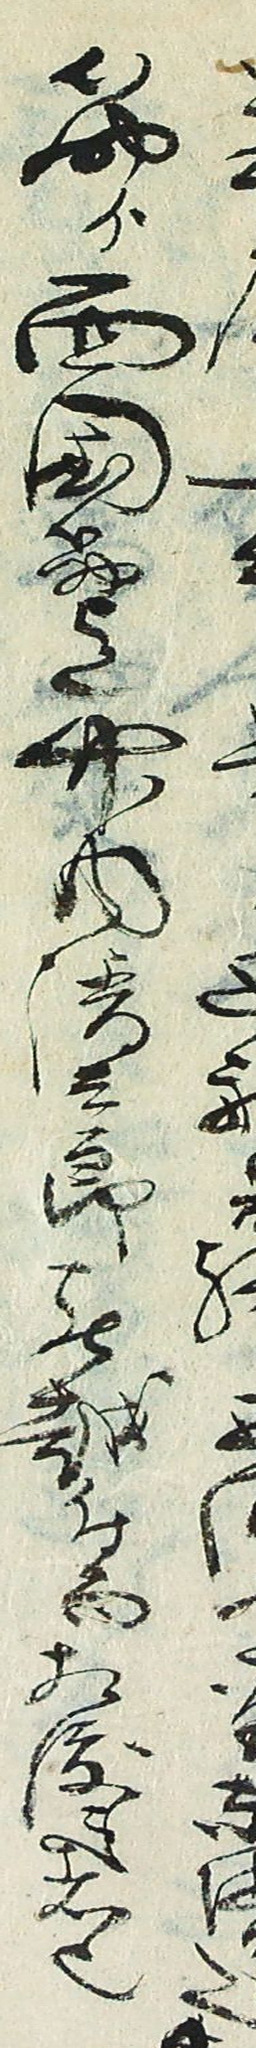筋ゟ西国筋迄竹内清太郎罷越付て相渡之者也
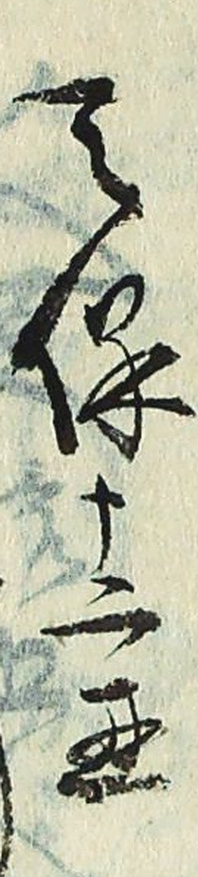天保十二丑
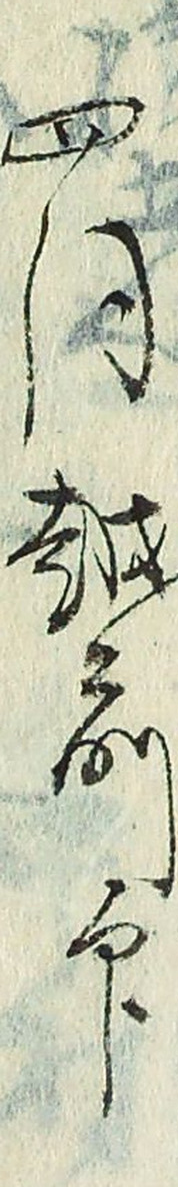四月越前印
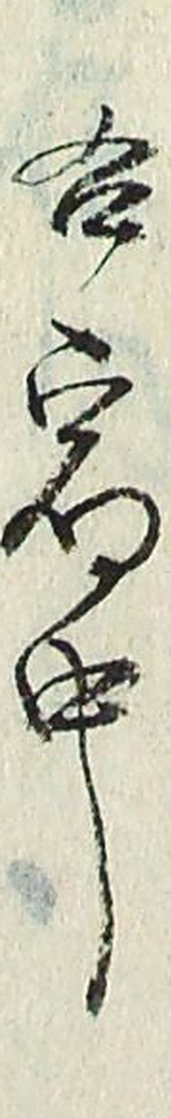右宿中
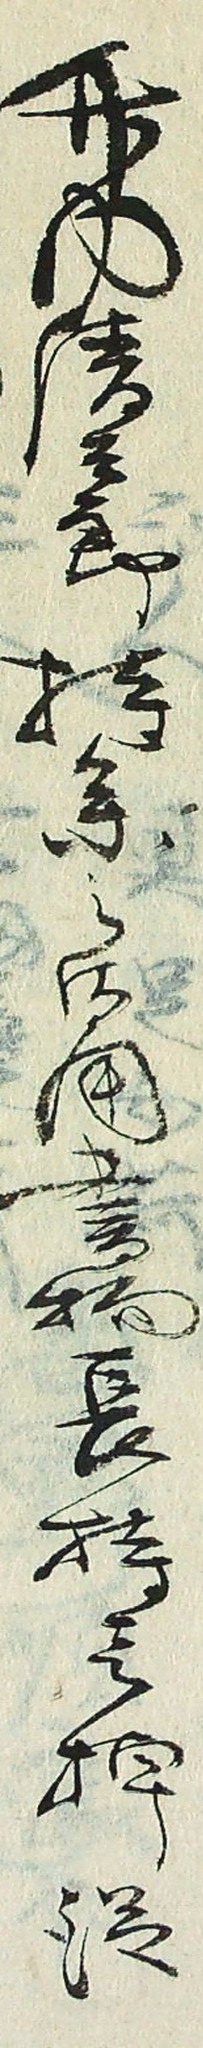竹内清太郎持参之御用書物長持壱棹従
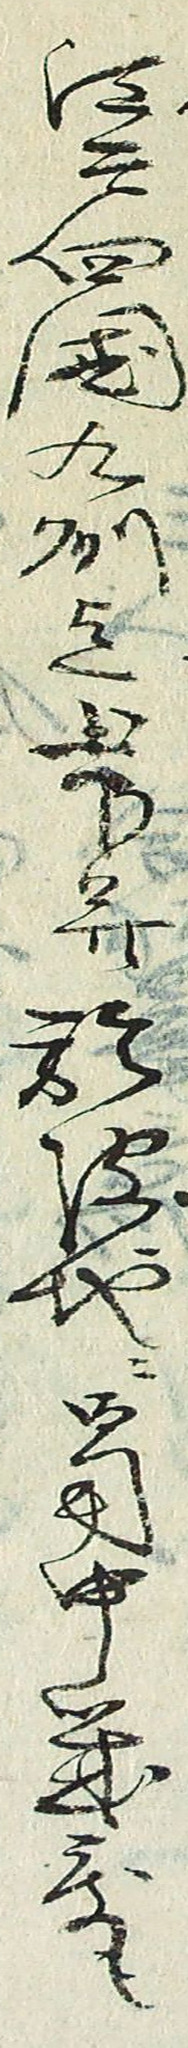江戸四国九州迄上下并於彼地御用中幾度も
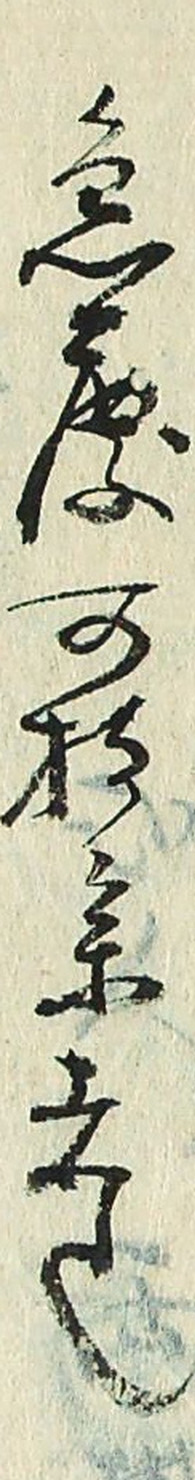急度可持参者也
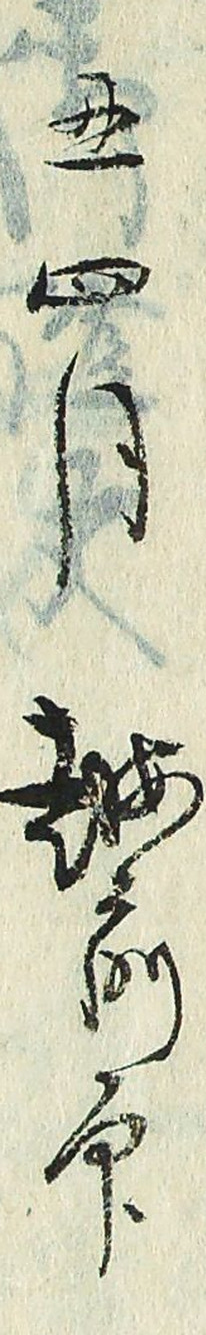丑四月越前印
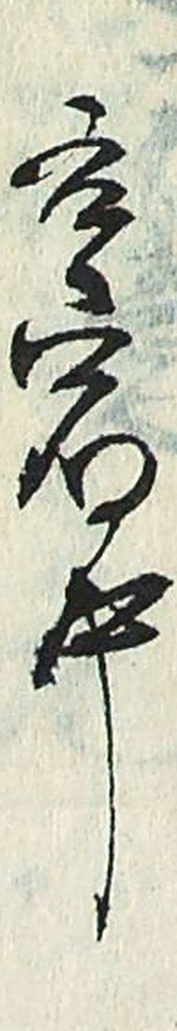右宿中
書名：公辺御役人為御廻浦御立越諸御用一巻
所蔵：鳴門教育大学 Naruto University of Education
